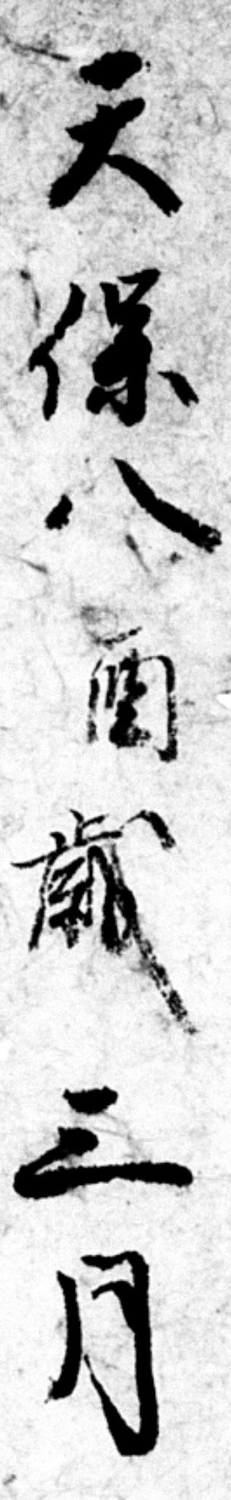天保八酉歳三月
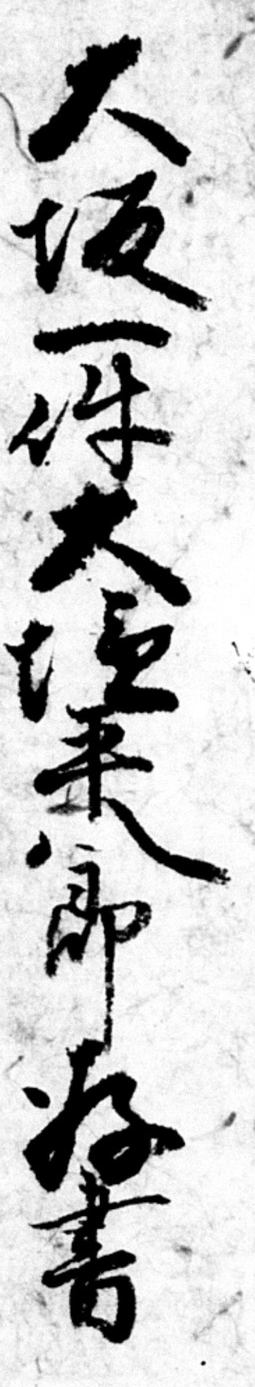大坂一件大塩平八郎存書

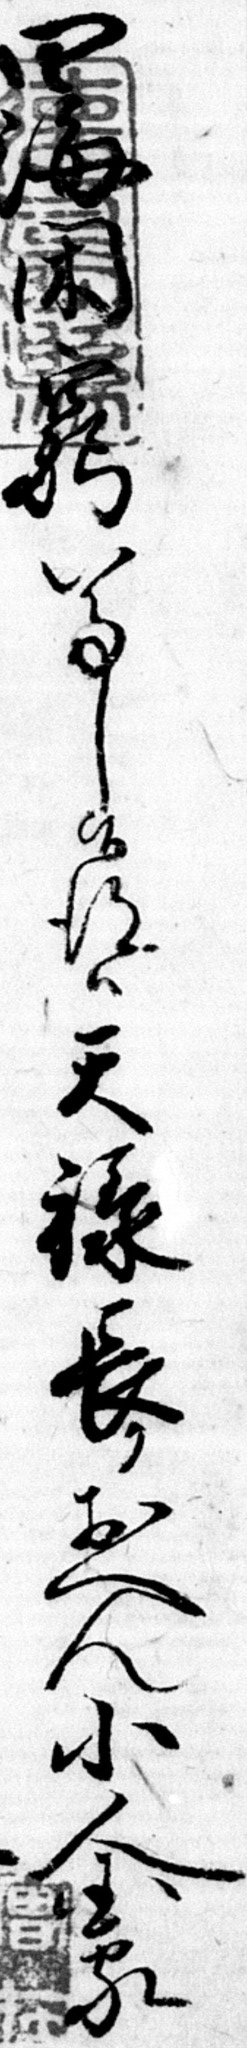四海困窮いたし候得は天禄長くおへん小人国家
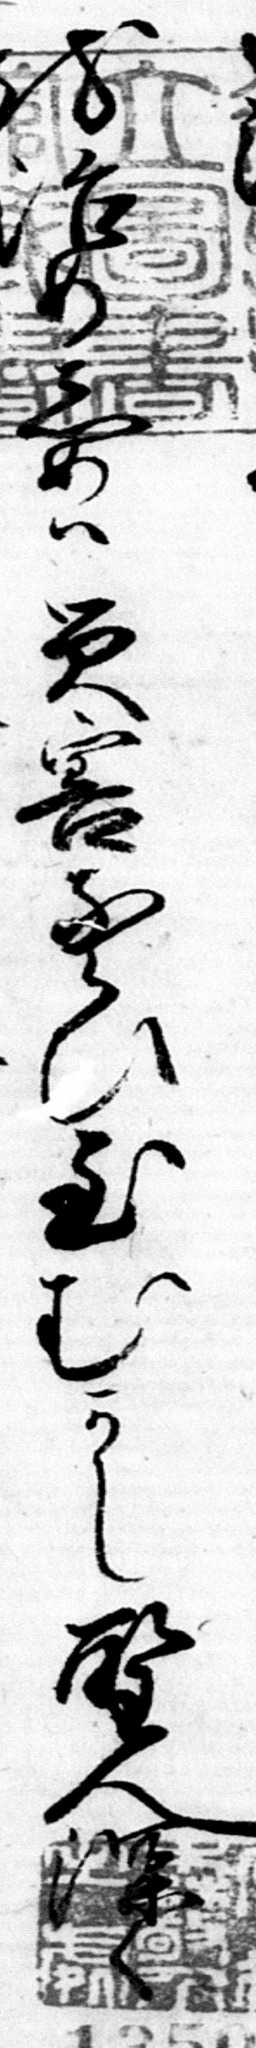を治めしめは災害ならひ至むかし聖人深く
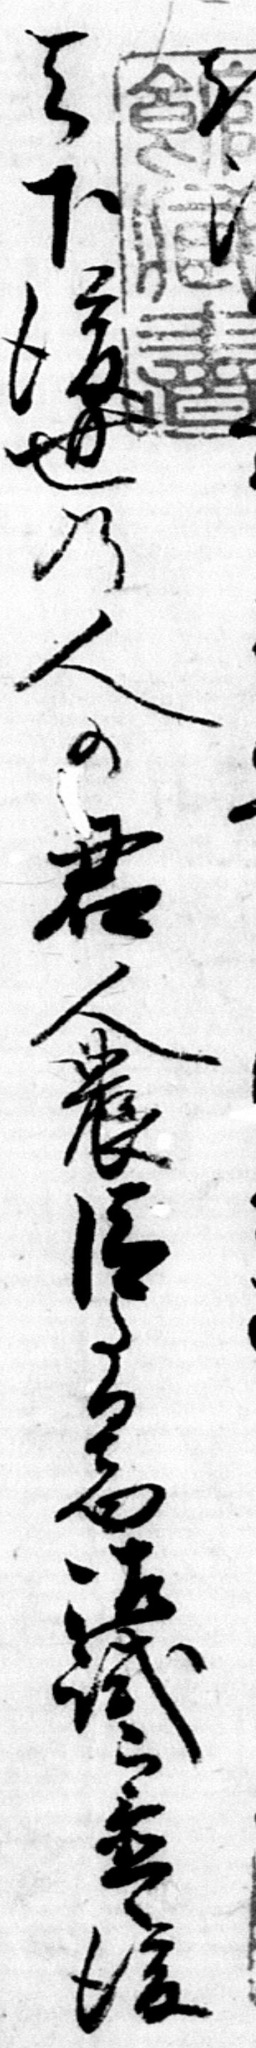天下後世の人の君人農臣たる者御試被置候後
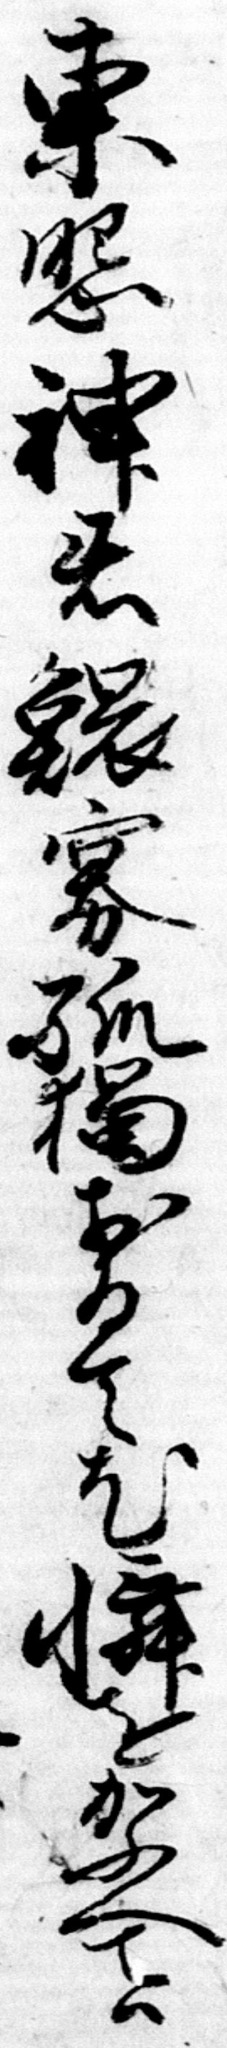東照神君鰥寡孤独おゐて尤憐を加ふへくは
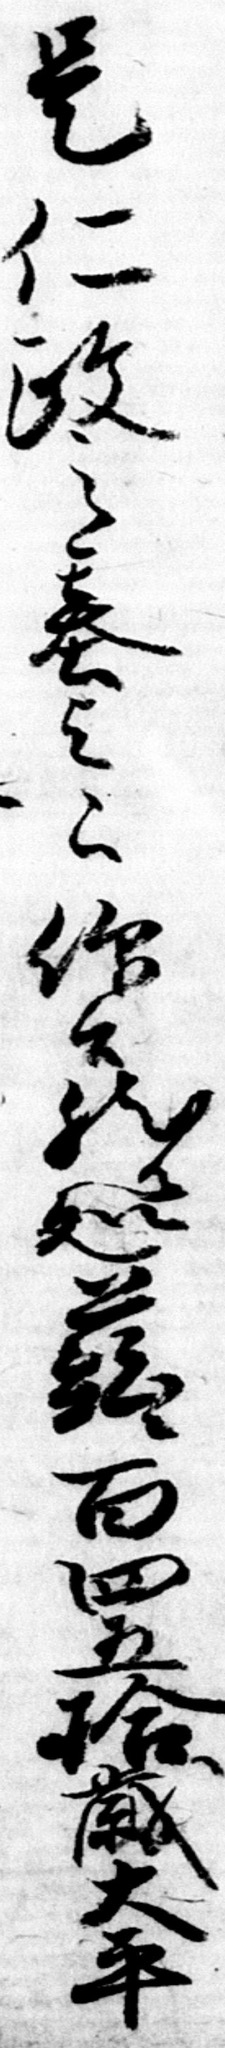是仁政之基と被仰候然る処茲に百四五拾歳大平
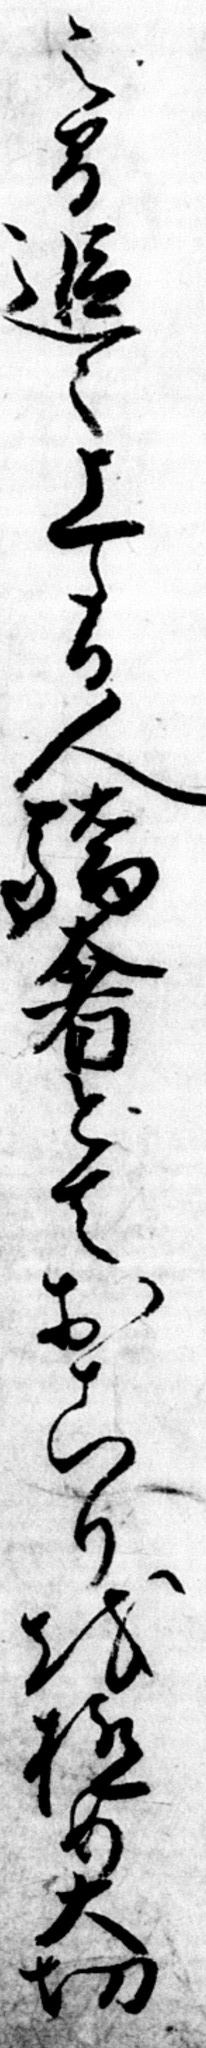之間追々上たる人驕奢とておこりを極め大切

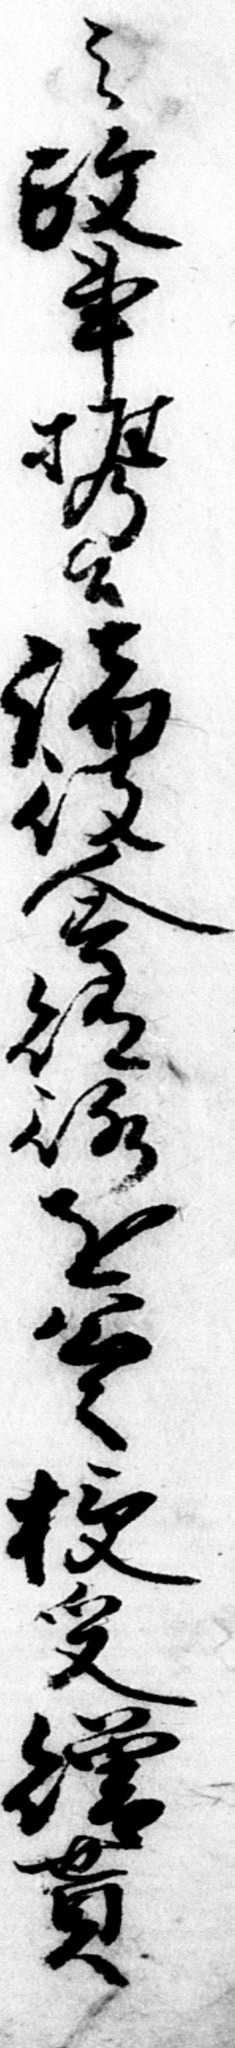之政事携候諸役人共賄賂を公々授受贈貰
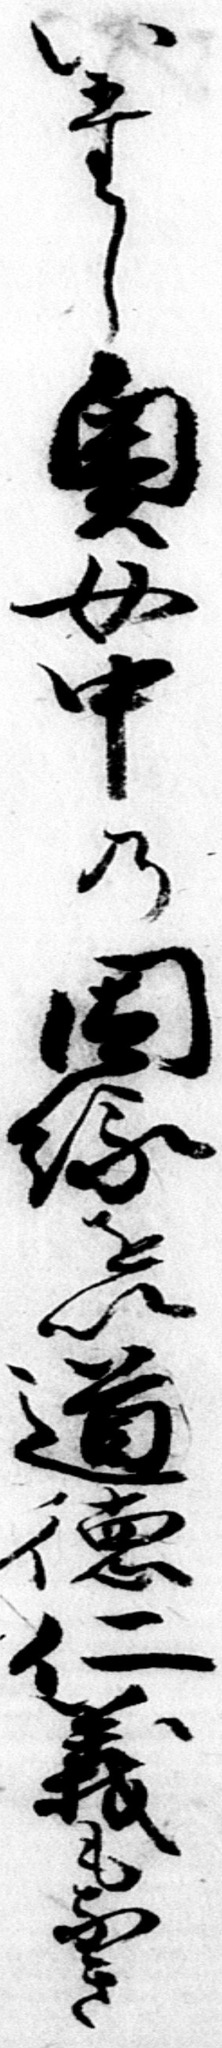いたし奥女中の因縁を以道徳仁義もなき
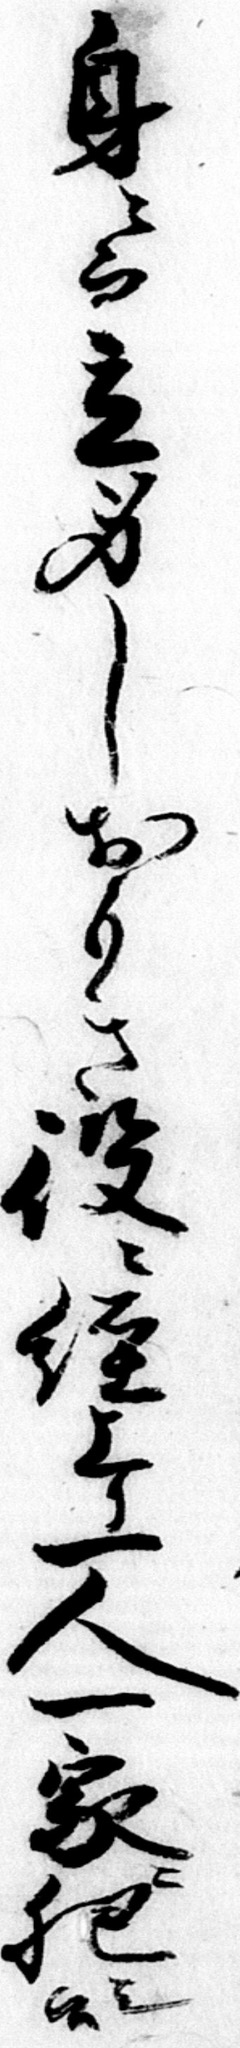身に而立身しおもき役に経上り一人一家に肥し候
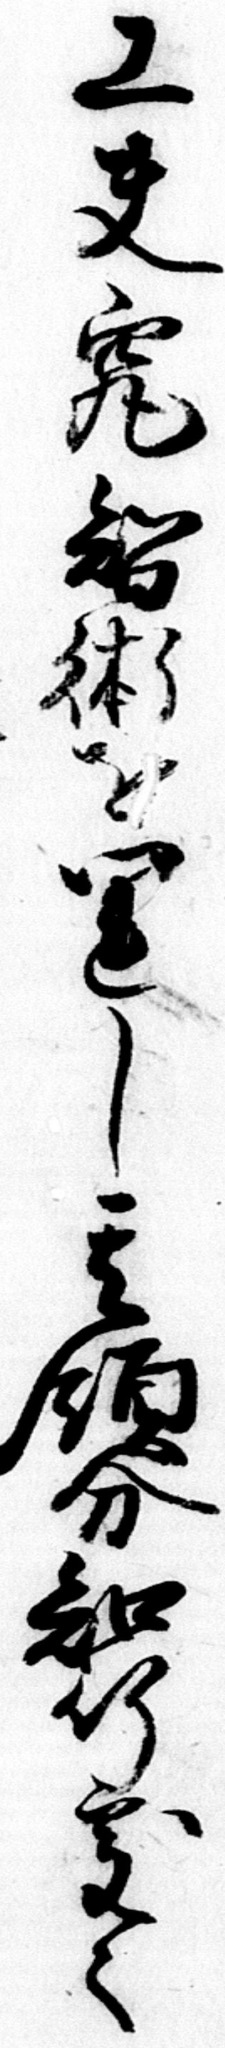工夫究智術を運し其領分知行処之
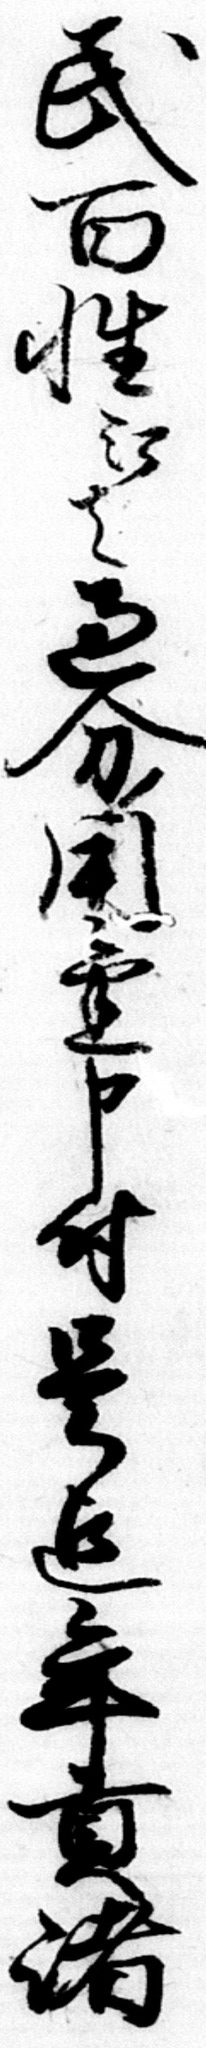民百性えは過分の用金申付是迄年貢諸
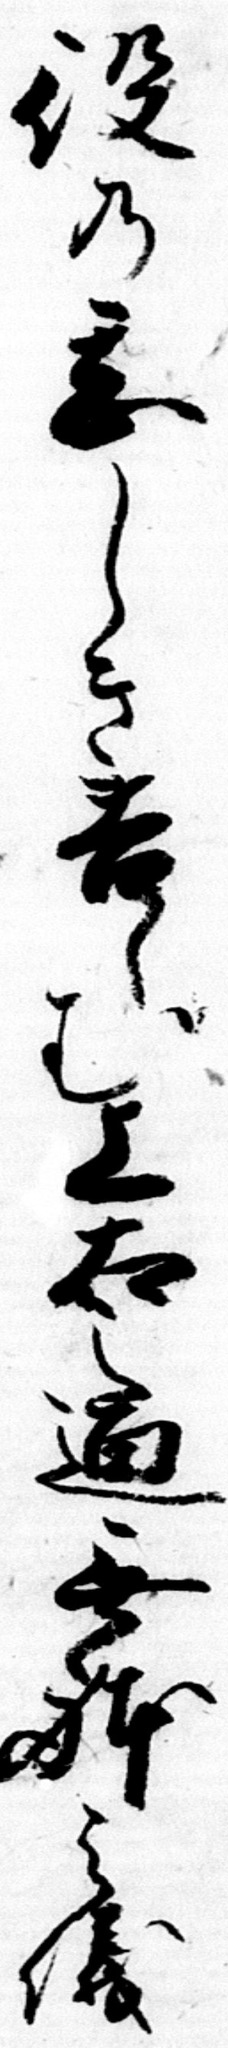役の甚しき苦しむ上右之通無躰之儀
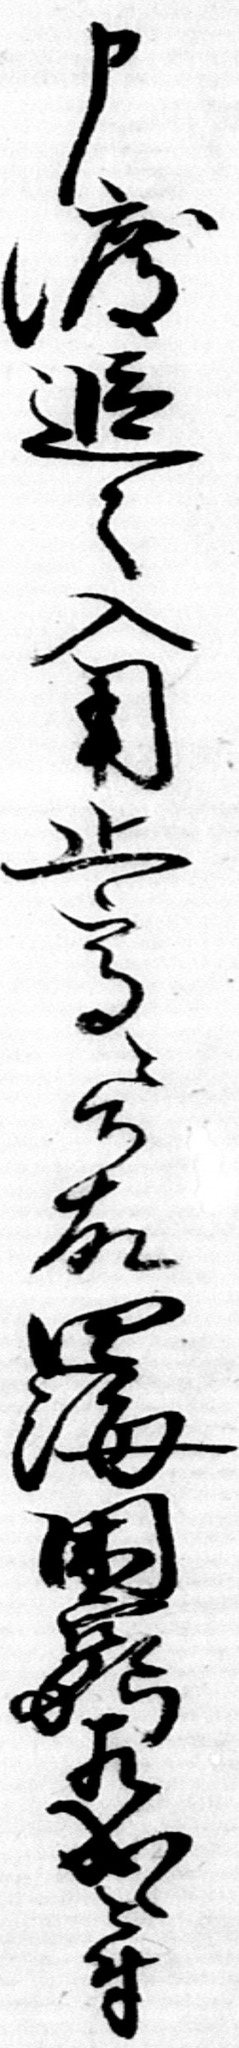申渡追々入用嵩に候故四海困窮相成候に付
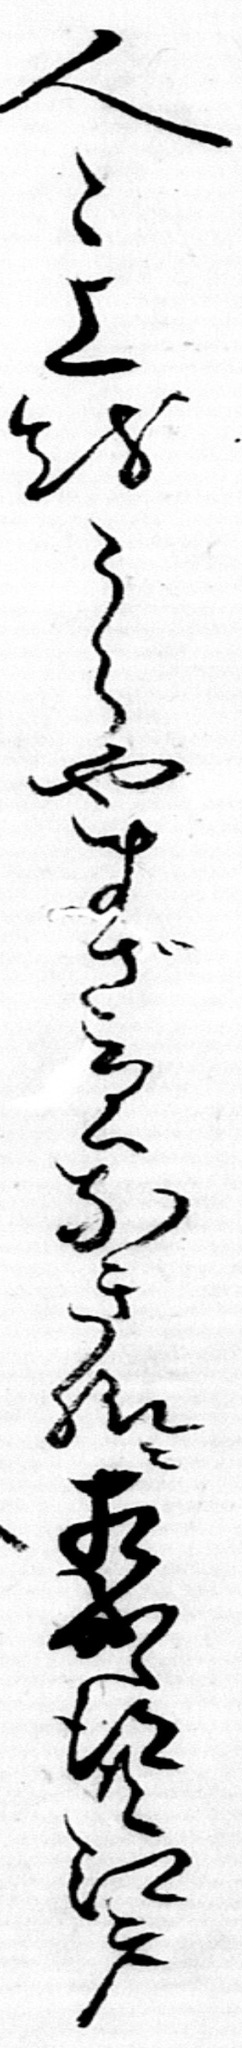人々上をうらやまざるはなき様に相成候得共江戸
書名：大坂一件大塩平八郎存書
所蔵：徳島県立図書館
